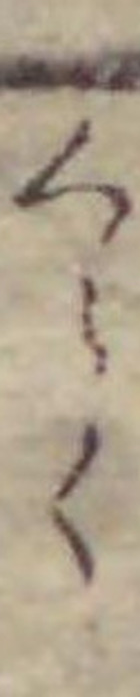くらく
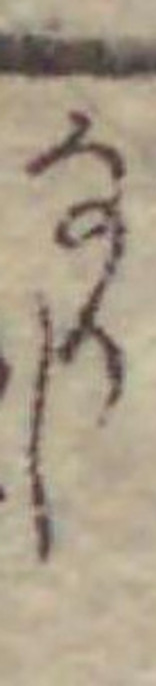なりし
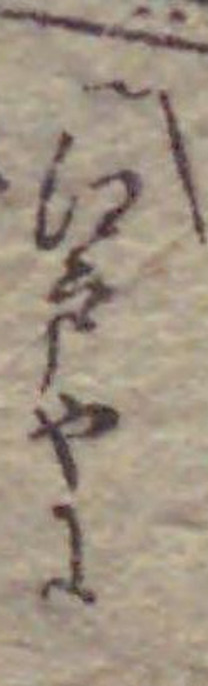〽江戸やに
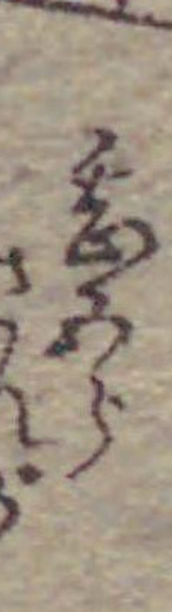甚五郎
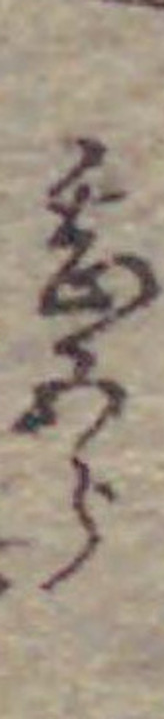甚五郎
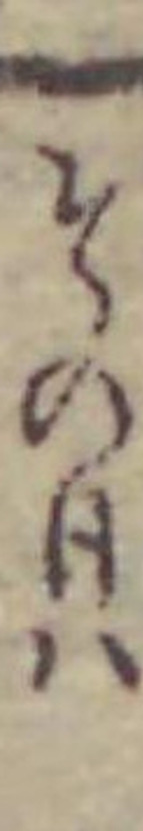その日は
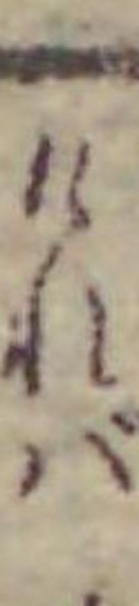ければ
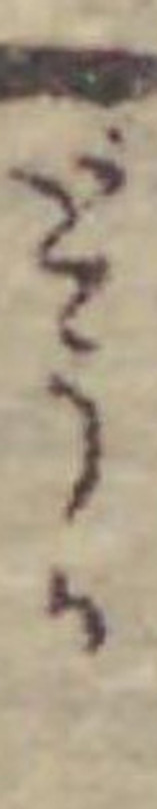どうか
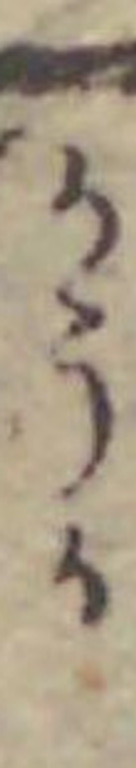かうか
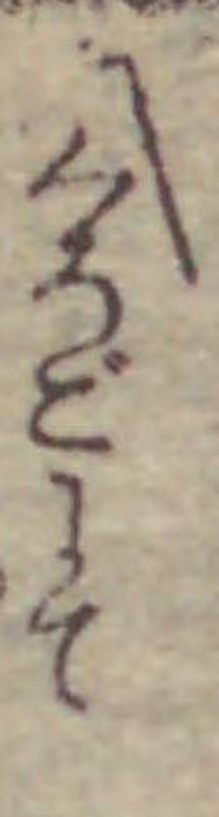〽くろごにて
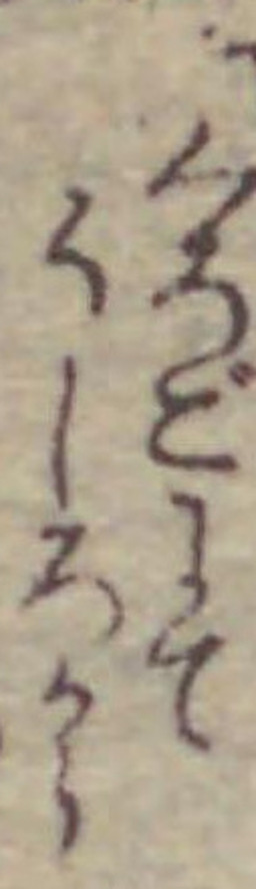うしろから
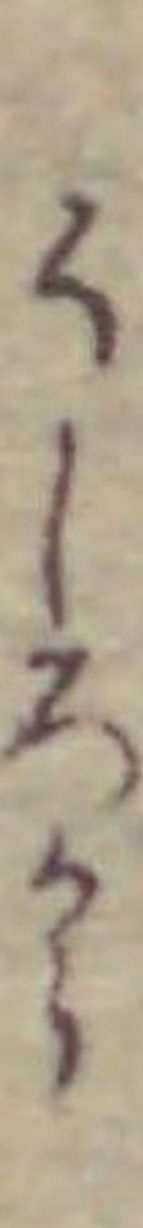うしろから
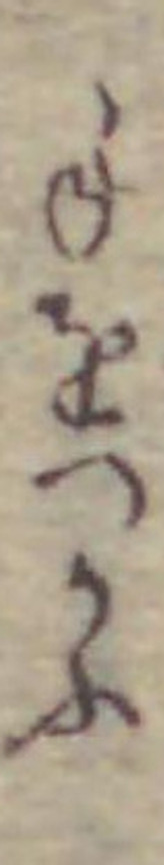手をつかふ
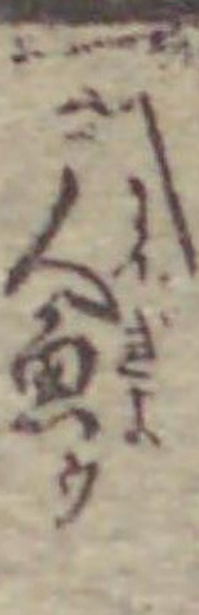〽人魚ぅ
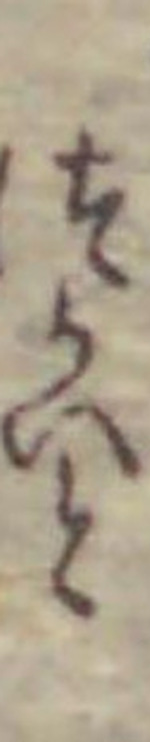つかいと
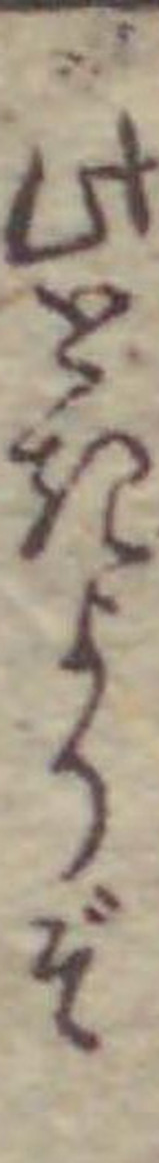此ときよりぞ
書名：箱入娘面屋人魚 3巻
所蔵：国立国会図書館 National Diet Library, JAPAN
